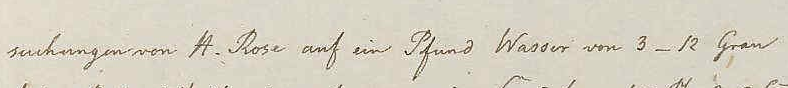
suchungen von H. Rose auf ein Pfund Wasser von 3–12 Gran
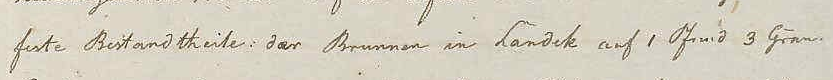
feste Bestandtheile: daer Brunnen in Landek auf 1 Pfund 3 Gran.
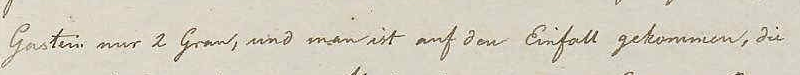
Gastein nur 2 Gran, und man ist auf den Einfall gekommen, die
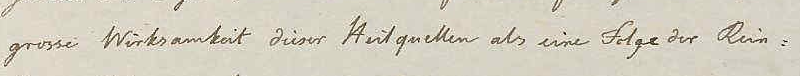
grosse Wirksamkeit diese Heilquellen als eine Folge Rein-
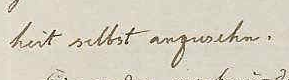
heit selbst anzusehn.
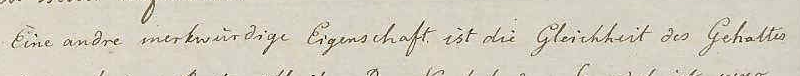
Eine andre merkwürdige Eigenschaft ist die Gleichheit dies Gehaltes
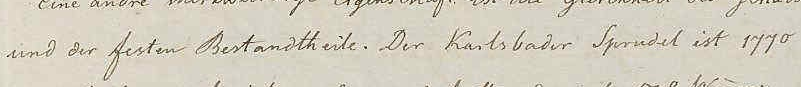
und der festen Bestandtheile. Der Karlsbader Sprudel ist 1770
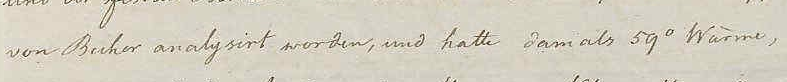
von Becher analysirt worden, und hatte damals 59° Wärme,
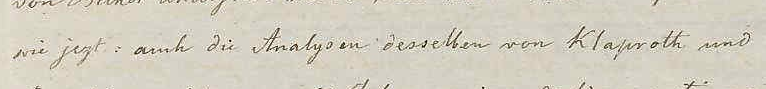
wie jezt: auch die Analysen desselben von Klaproth und
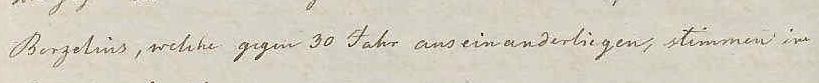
Berzelius, welche gegen 30 Jahr auseinanderliegen, stimmen im
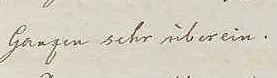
Ganzen sehr überein.
